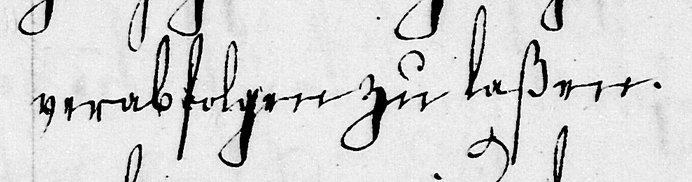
verabfolgen zu laßen.
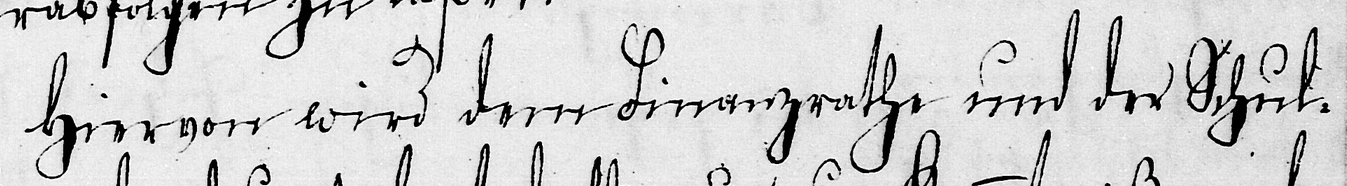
Hiervon wird dem Finanzrathe und der Schul¬
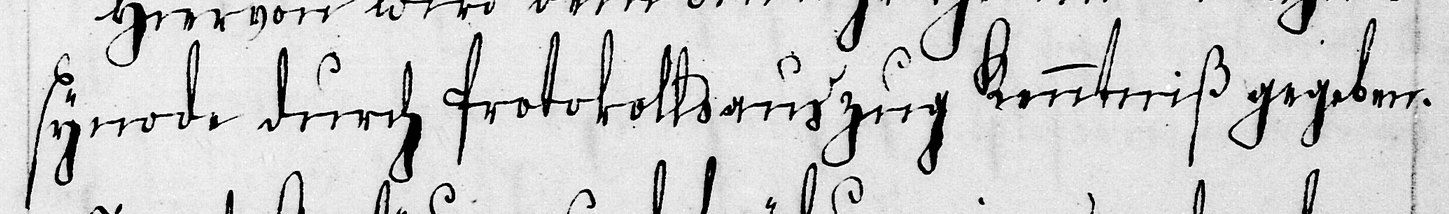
synode durch Protokollsauszug Kenntniß gegeben.
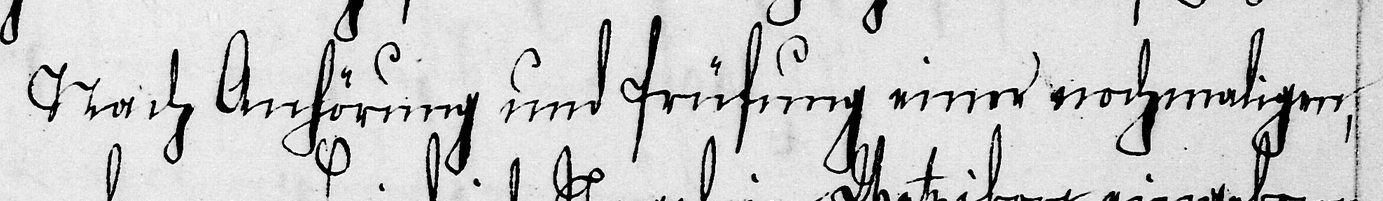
Nach Anhörung und Prüfung einer nochmaligen,
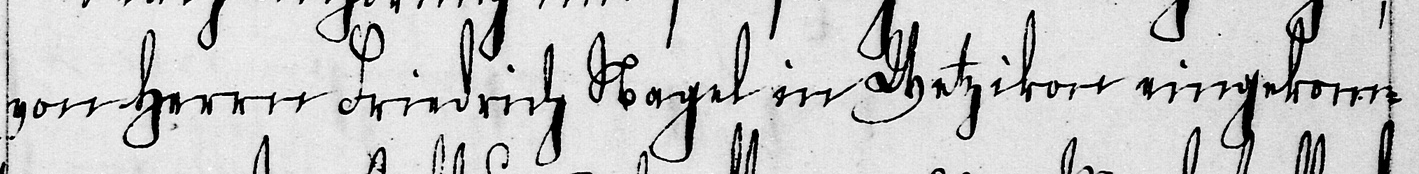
von Herrn Friedrich Nagel in Wetzikon eingekom¬
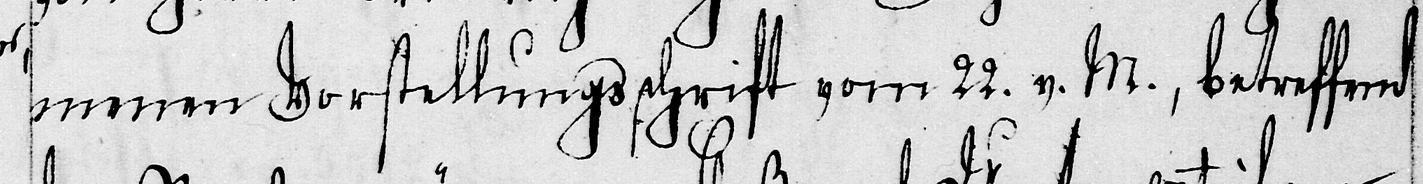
menen Vorstellungsschrift vom 22. v. M., betreffe¬
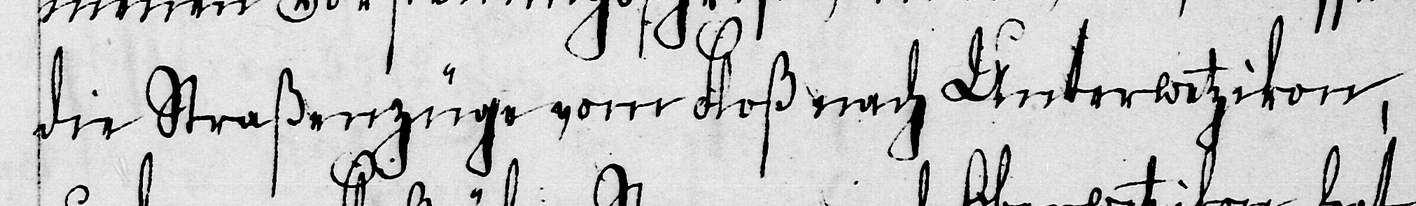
die Straßenzüge vom Floß nach Unterwetzikon,
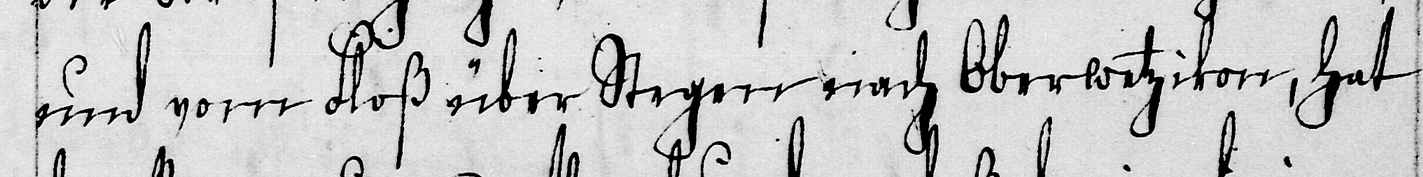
und vom Floß über Stegen nach Oberwetzikon, hat
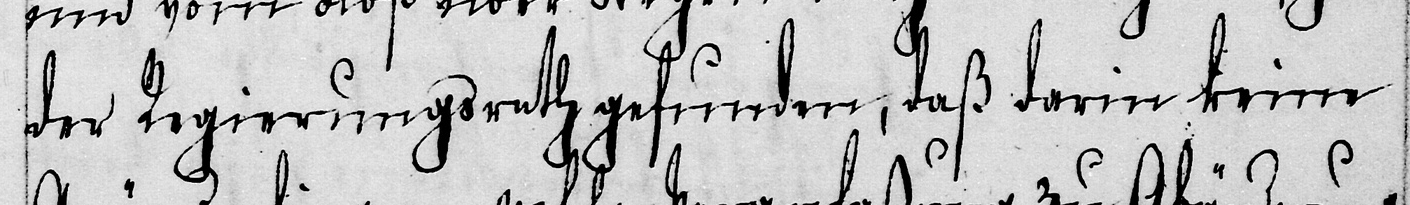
der Regierungsrath gefunden, daß darin keine
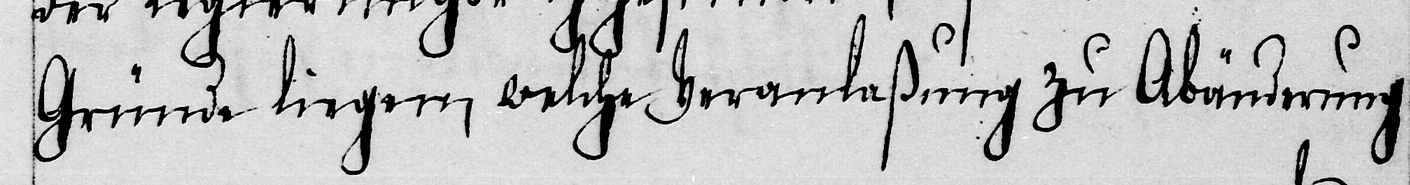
Gründe liegen, welche Veranlaßung zu Abänderung
